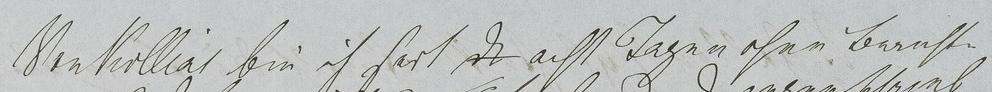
Von Killias bin ich seit acht Tagen ohne Berichte
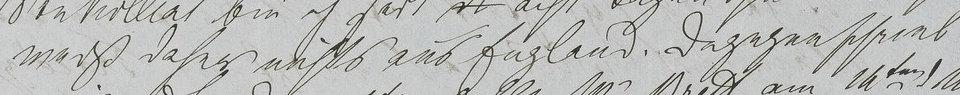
weiß daher nichts aus England. Dagegen schrieb
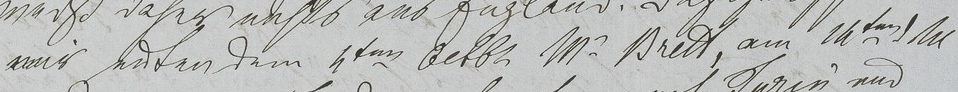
mir unter dem 4ten Octbr MrBrett, am 14ten dM
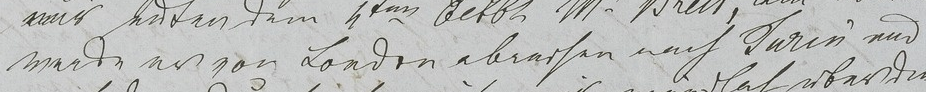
werde er von London abreisen nach Turin und
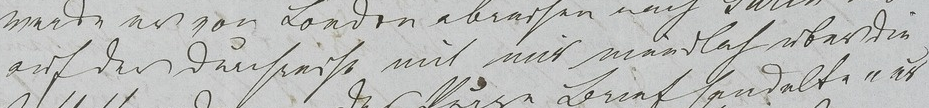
auf der Durchreise mit mir mündlich über die
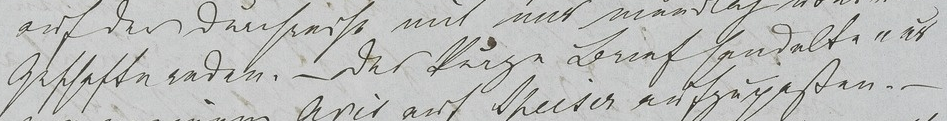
Geschäfte reden. – Der kurze Brief handelte nur
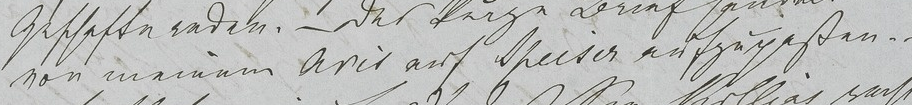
von meinem Avis auf Speiser aufzupaßen. –
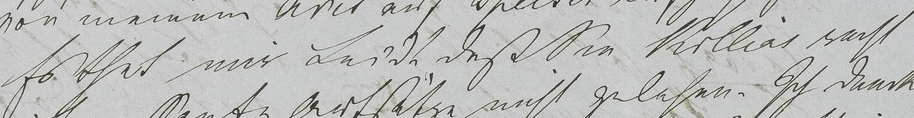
Es thut mir Leidt daß Sie Killias recht
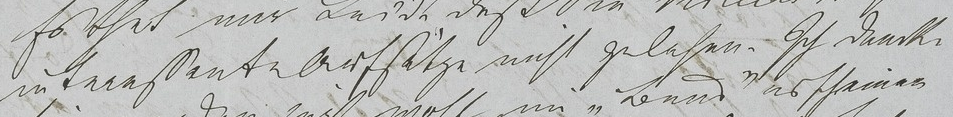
intereßante Aufsätze nicht gelesen. Ich dencke
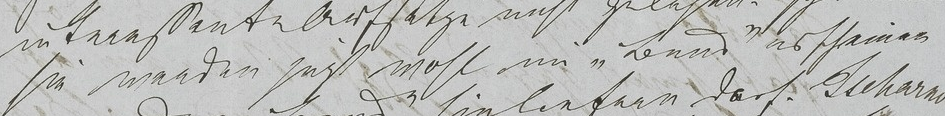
sie werden jezt wohl im «Bund» erscheinen
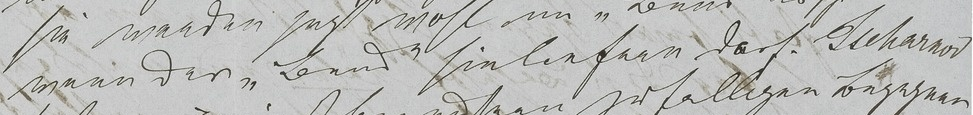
wenn der «Bund» sie liefern darf. Tscharner
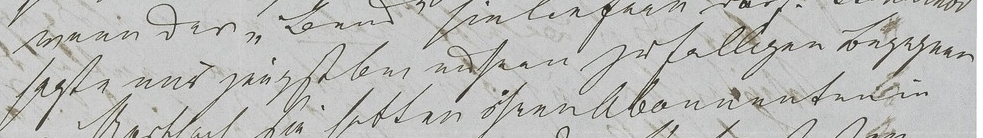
sagte mir jüngst bei unsern zufälligen Begegnen
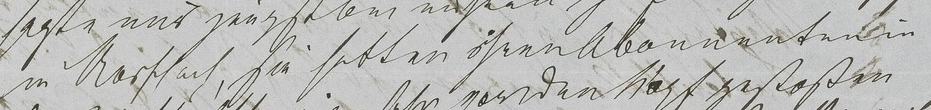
in Rorschach, sie hätten ihren Abonnenten in
